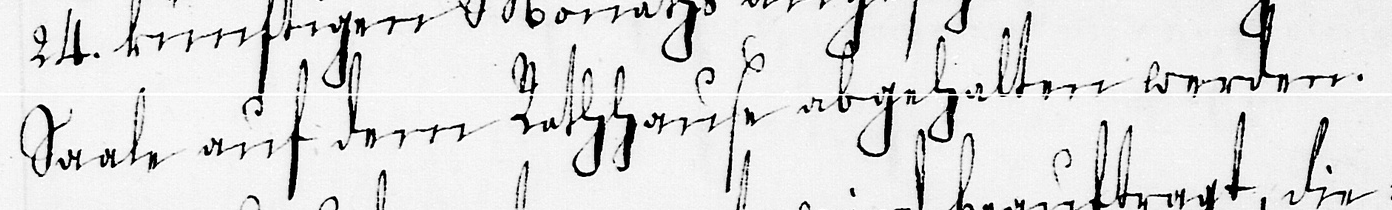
Saale auf dem Rathhause abgehalten werden.
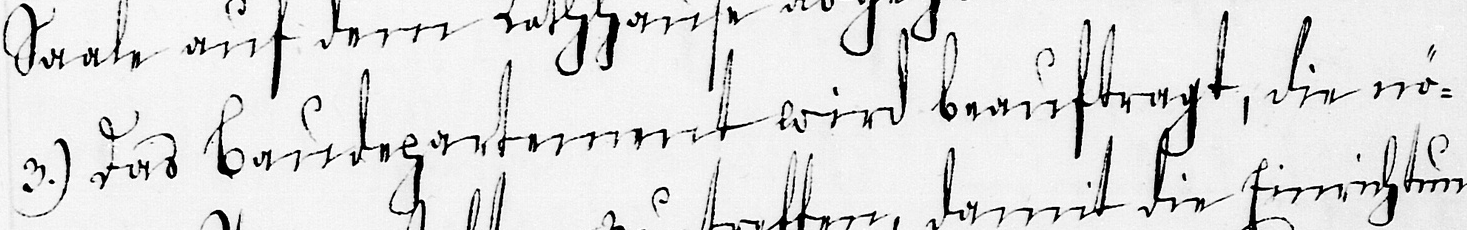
3.) Das Baudepartement wird beauftragt, die nö¬
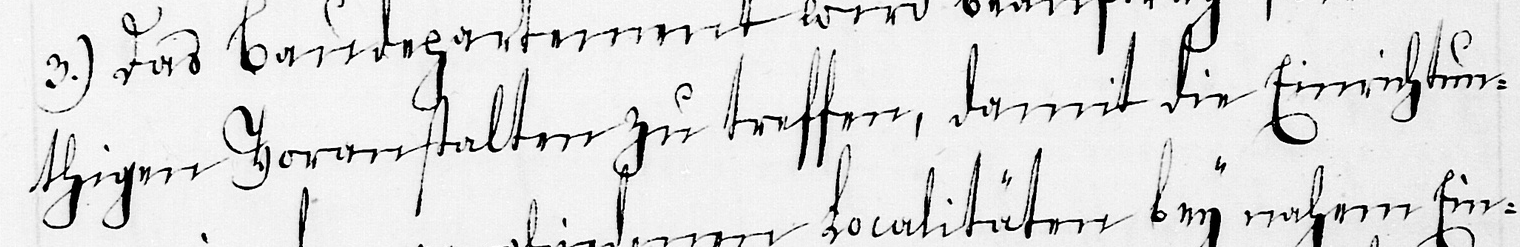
thigen Voranstalten zu treffen, damit die Einrichtun¬
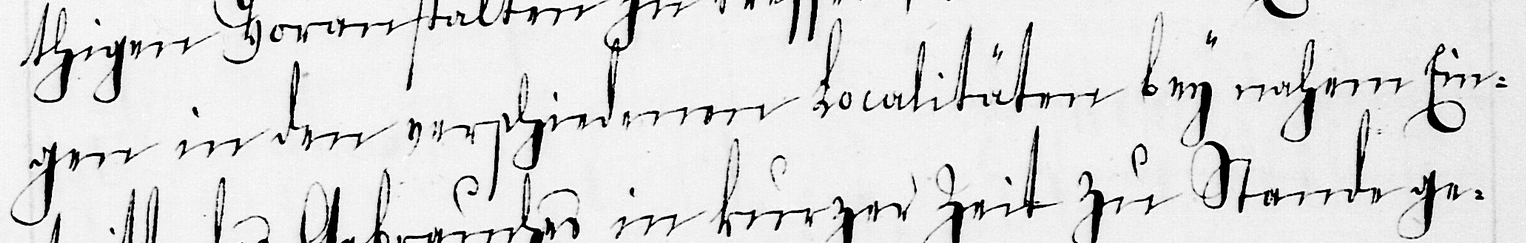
gen in den verschiedenen Localitäten bey nahem Ein¬
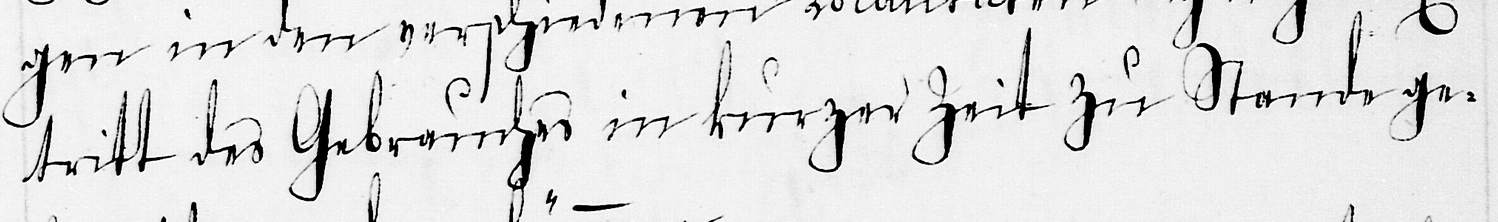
tritt des Gebrauches in kurzer Zeit zu Stande ge¬
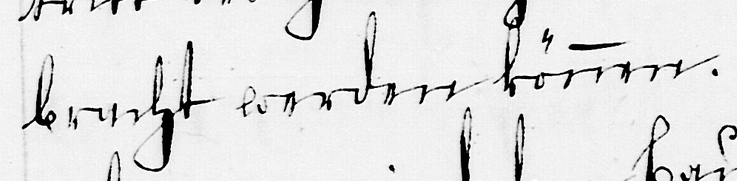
bracht werden können.
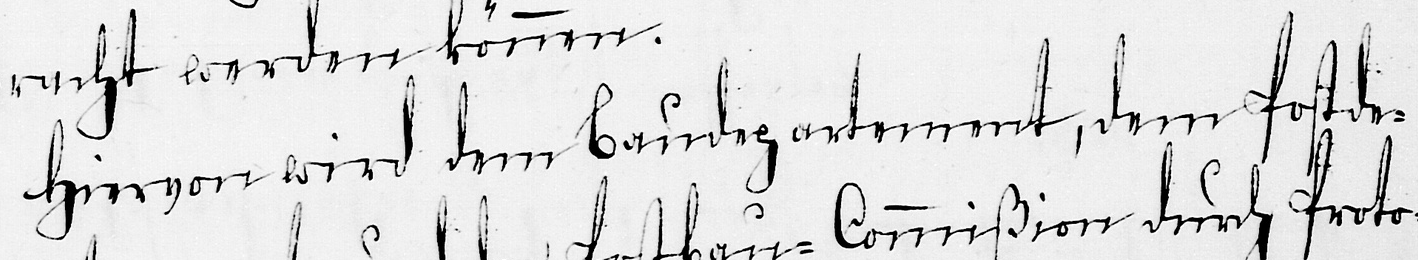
Hiervon wird dem Baudepartement, dem Postde¬
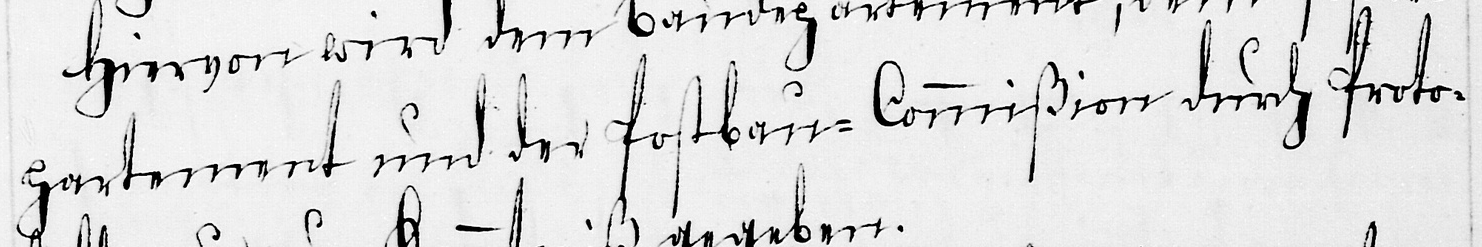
partement und der Postbau-Commißion durch Proto¬
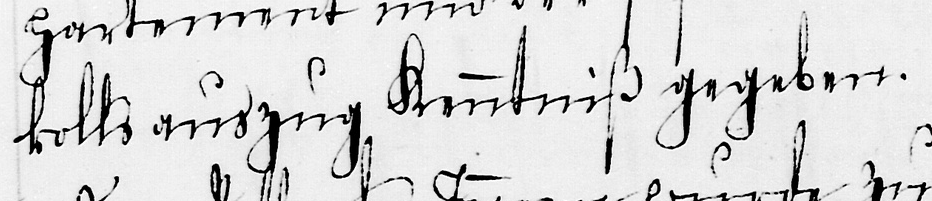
kollsauszug Kenntniß gegeben.
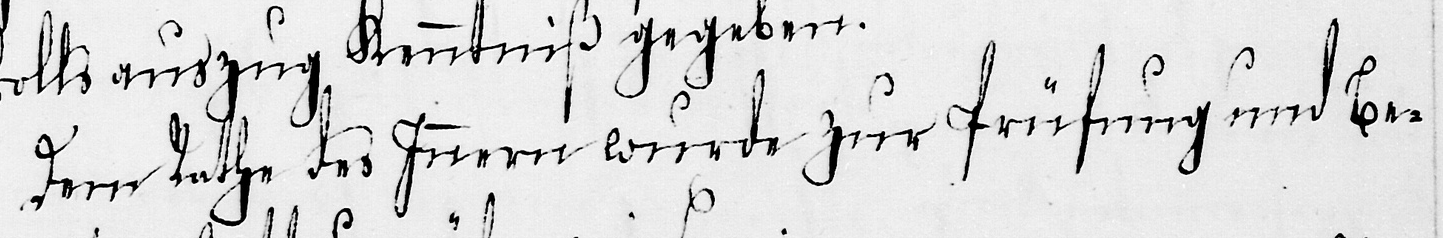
Dem Rathe des Innern wurde zur Prüfung und Be¬
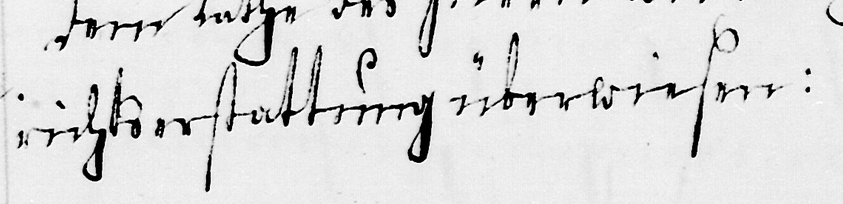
richtserstattung überwiesen:
